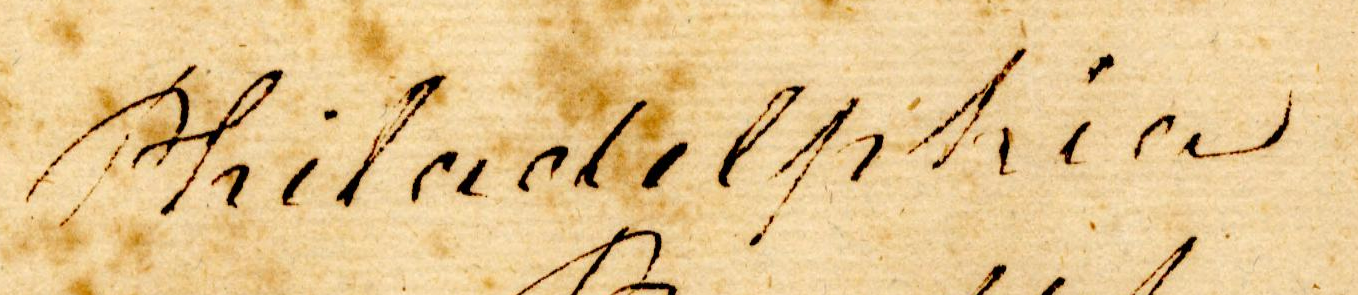Philadelphia
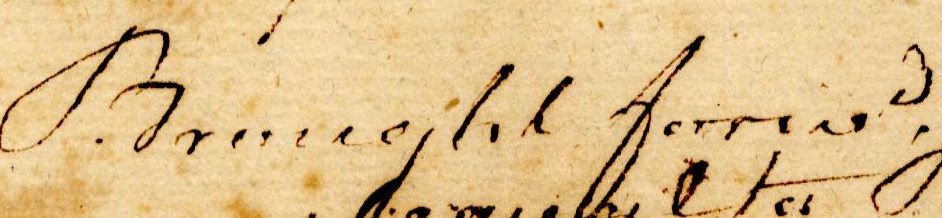Brought forrw^d
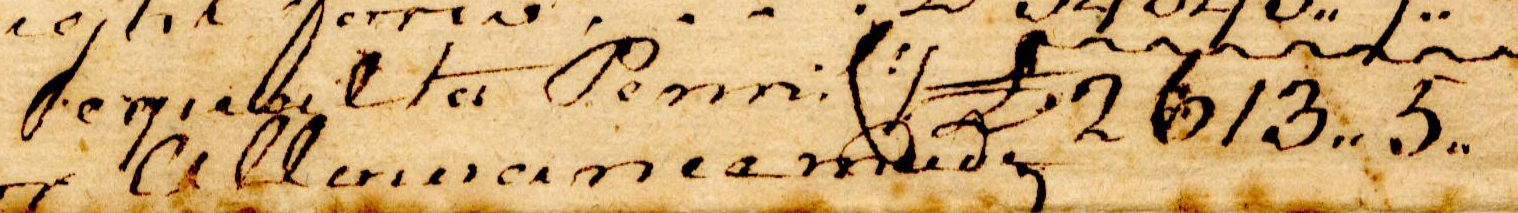equal to Pem: £2613..5..
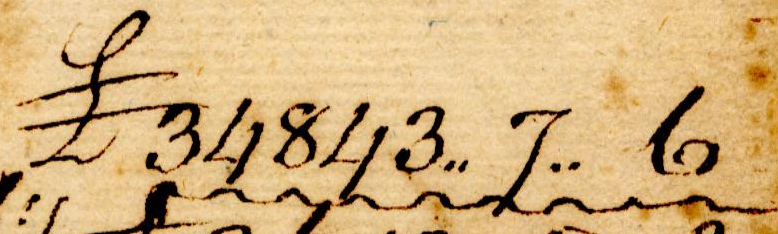£34843.7.6
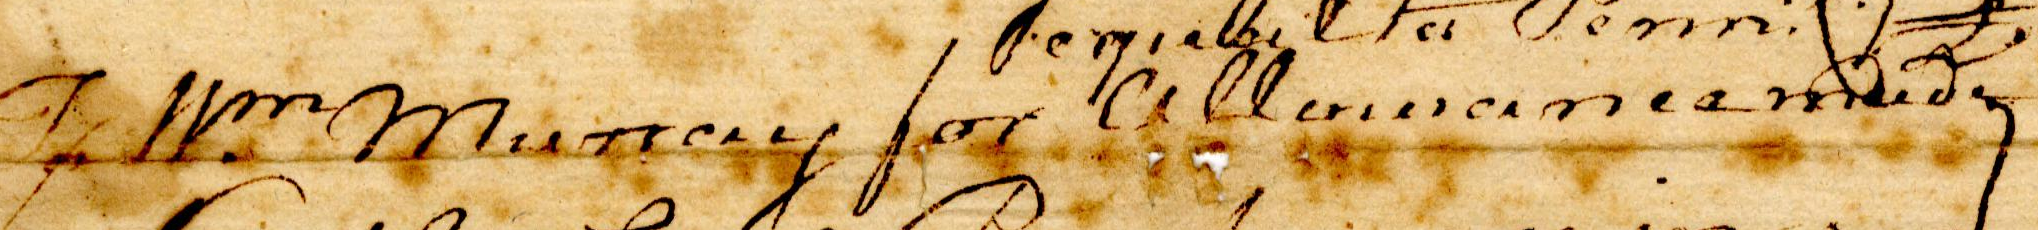To W^m Murray for Allowance made
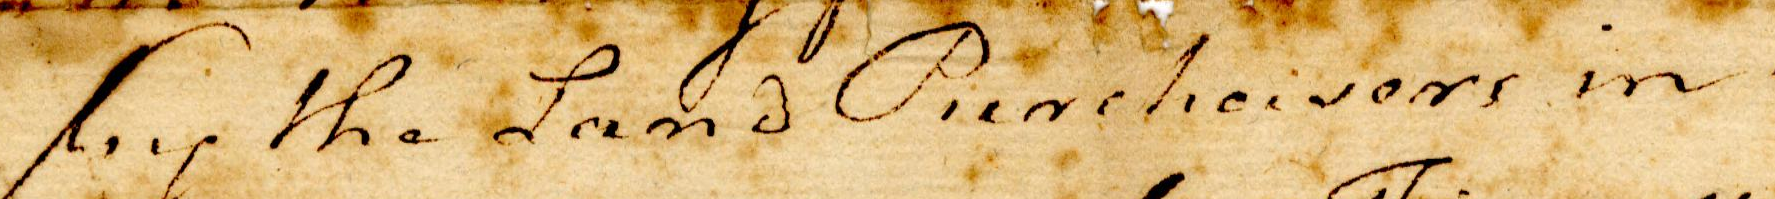by the Land Purchasers in
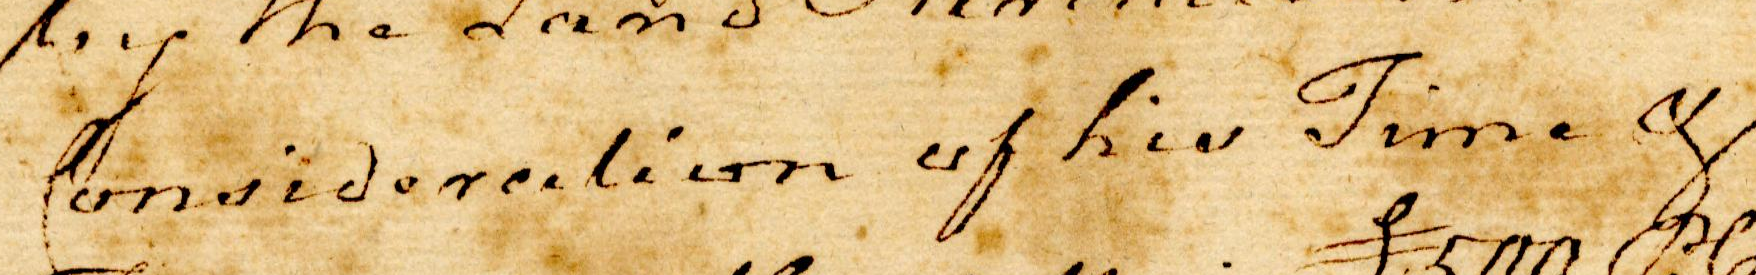Consideration of his Time^g
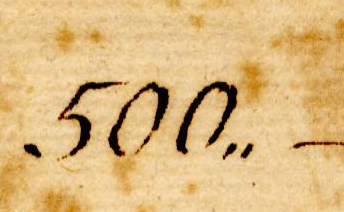500.-.-
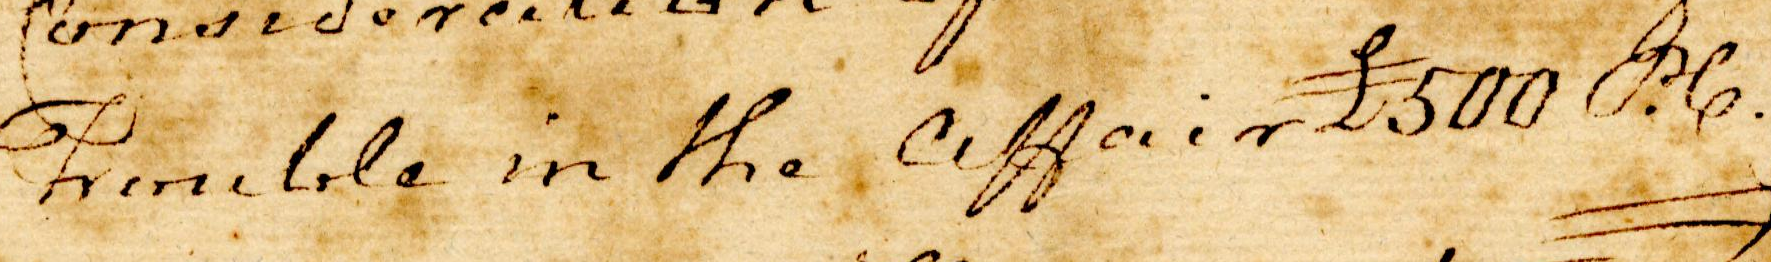Trouble in the affair £500 P.C.
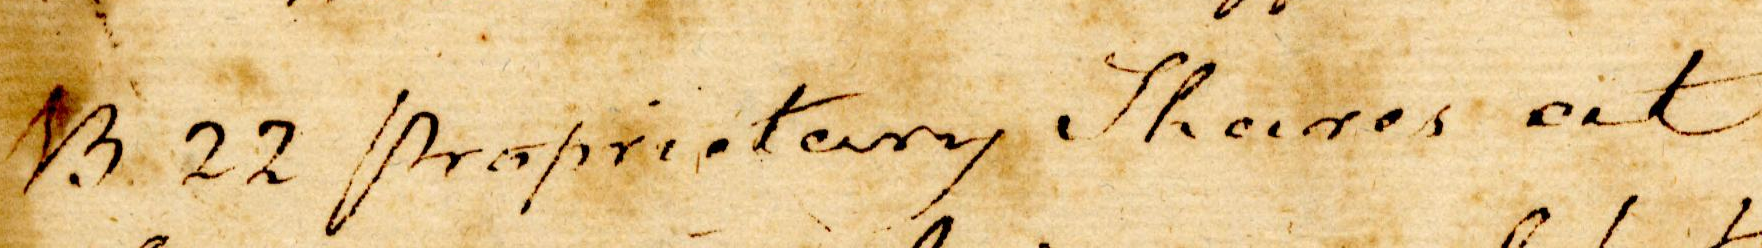NB 22 proprietary Shares at
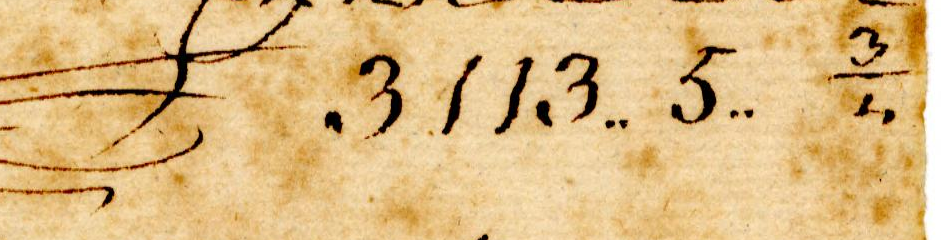£ 3113.5. 3/4
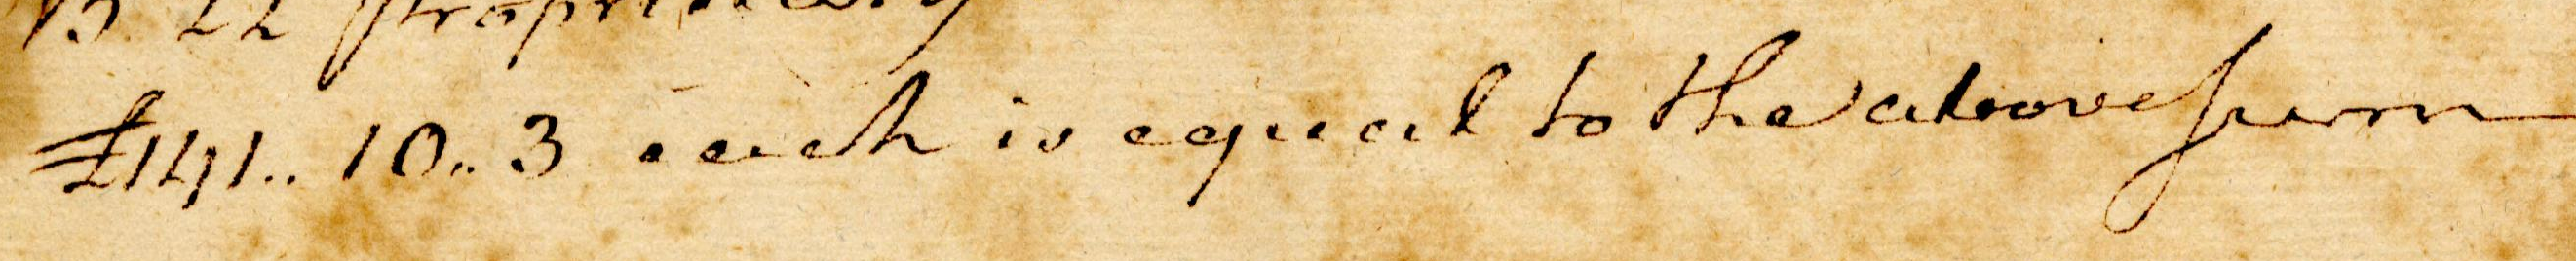£141.10.3 each is equal to the above sum
